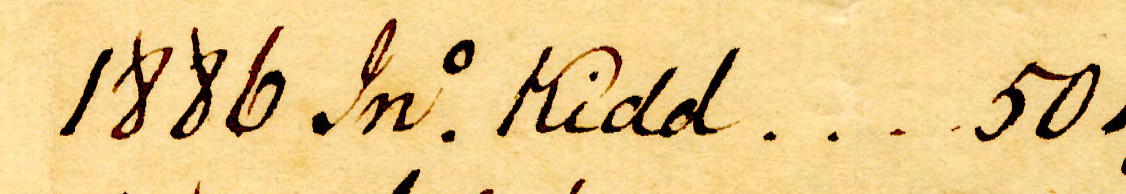1886 Jn^o. Kidd .... 50
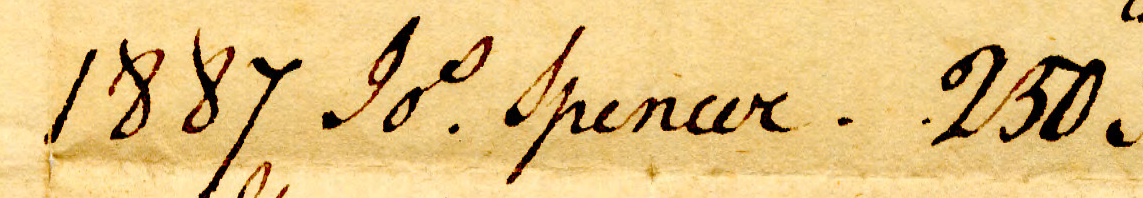1887 Jo^s. Spencer.. 250
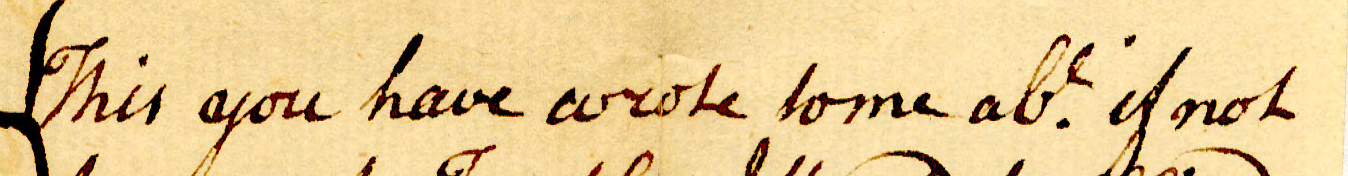This you have wrote home ab^t. if not
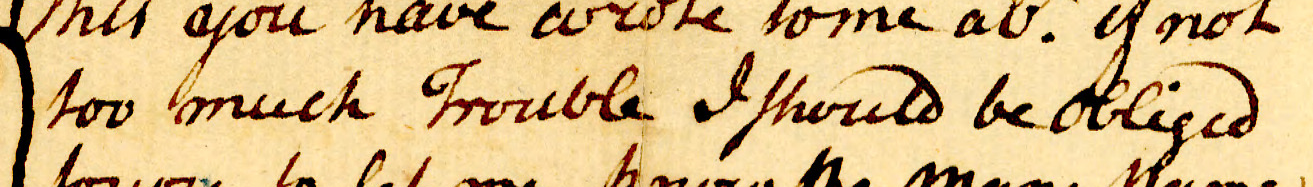too much Trouble I should be obliged
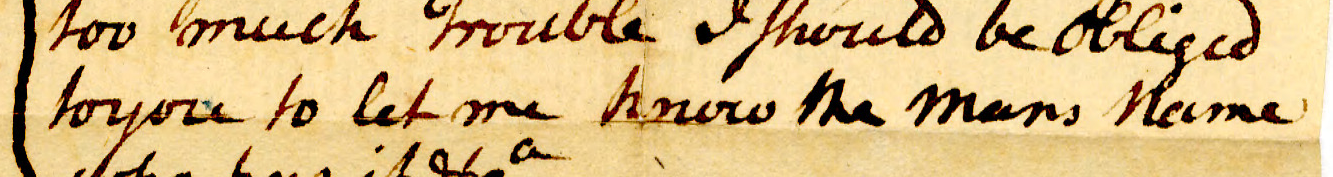to you to let me know the mans name
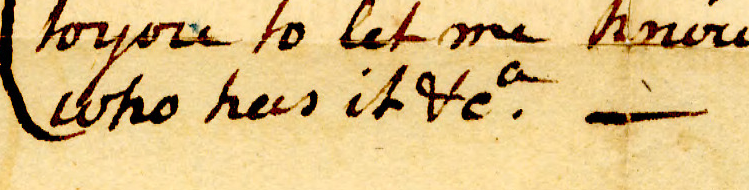who has it &c^a.-
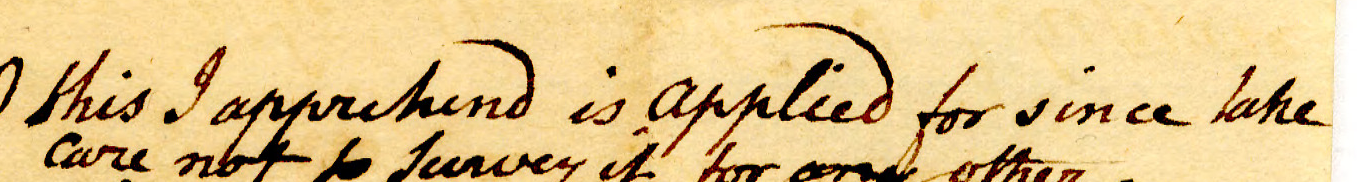this I apprehend is applied for since take
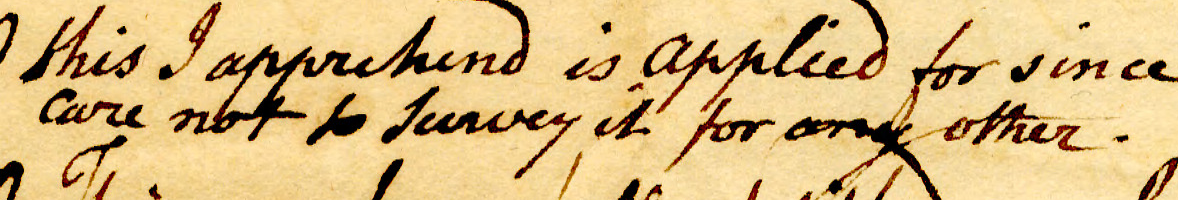care not to survey it for any other.
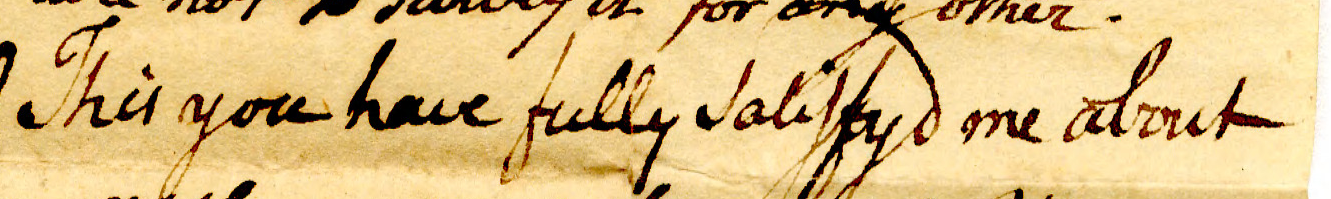This you have fully satisfyd me about
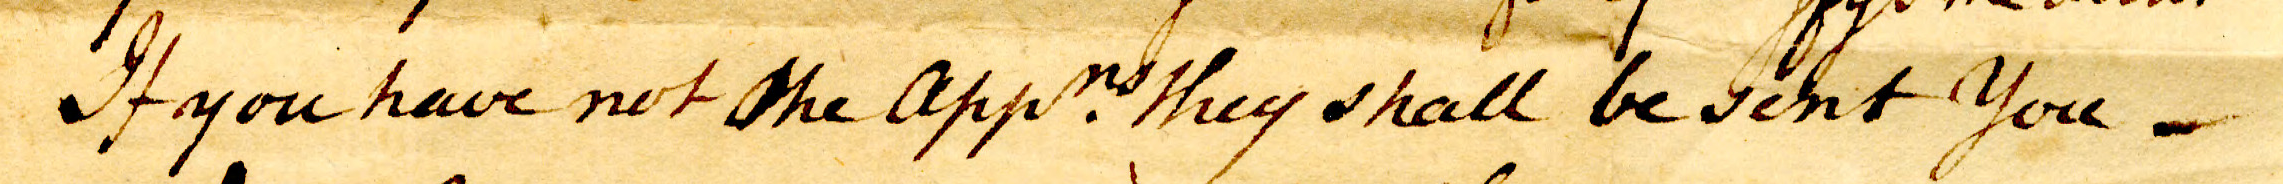If you have not the app^ns. they shall be sent you-
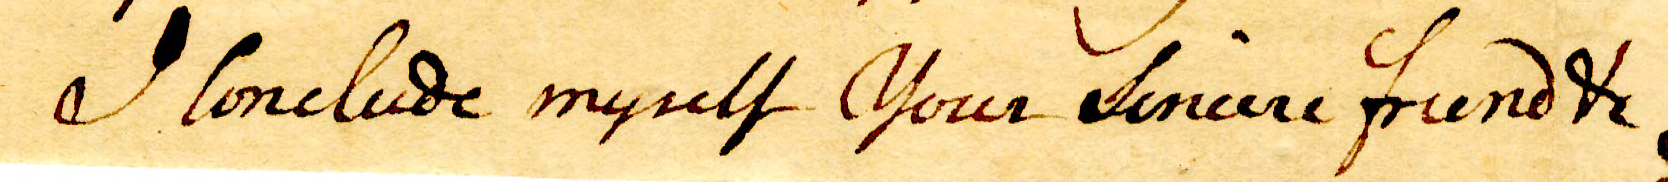I conclude myself Your sincere Friend &c
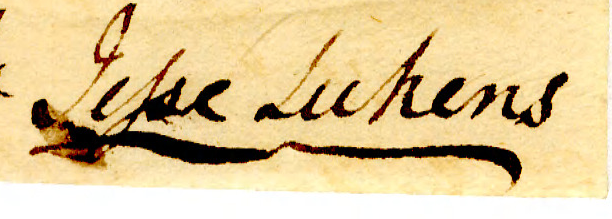Jesse Lukens
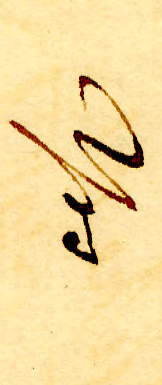Yrs
